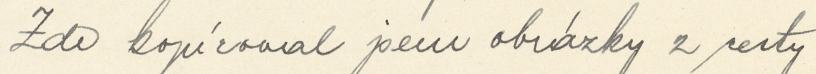Zde kopíroval jsem obrázky z cesty
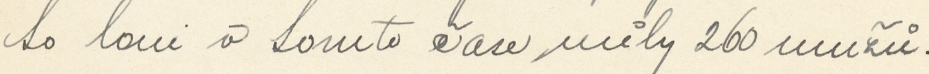to loni v tomto čase měly 260 mužů.
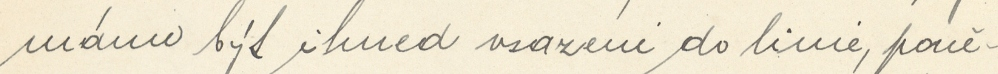máme být ihned vsazeni do linie, poně-
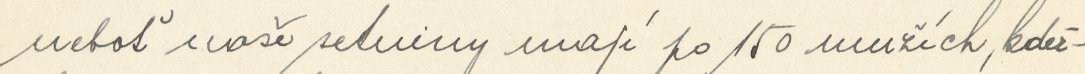neboť naše setniny mají po 150 mužích, kdež-
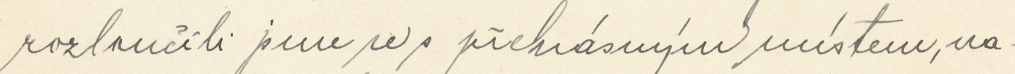rozloučili jsme se s překrásným místem, na-
